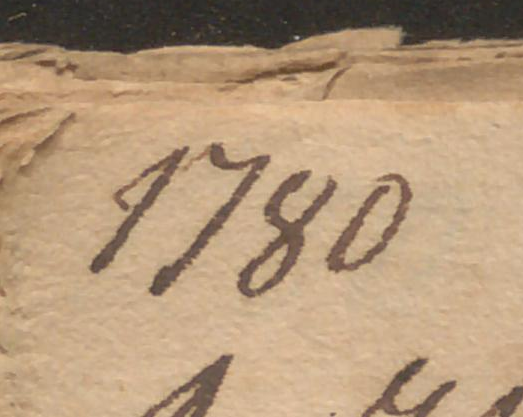1780
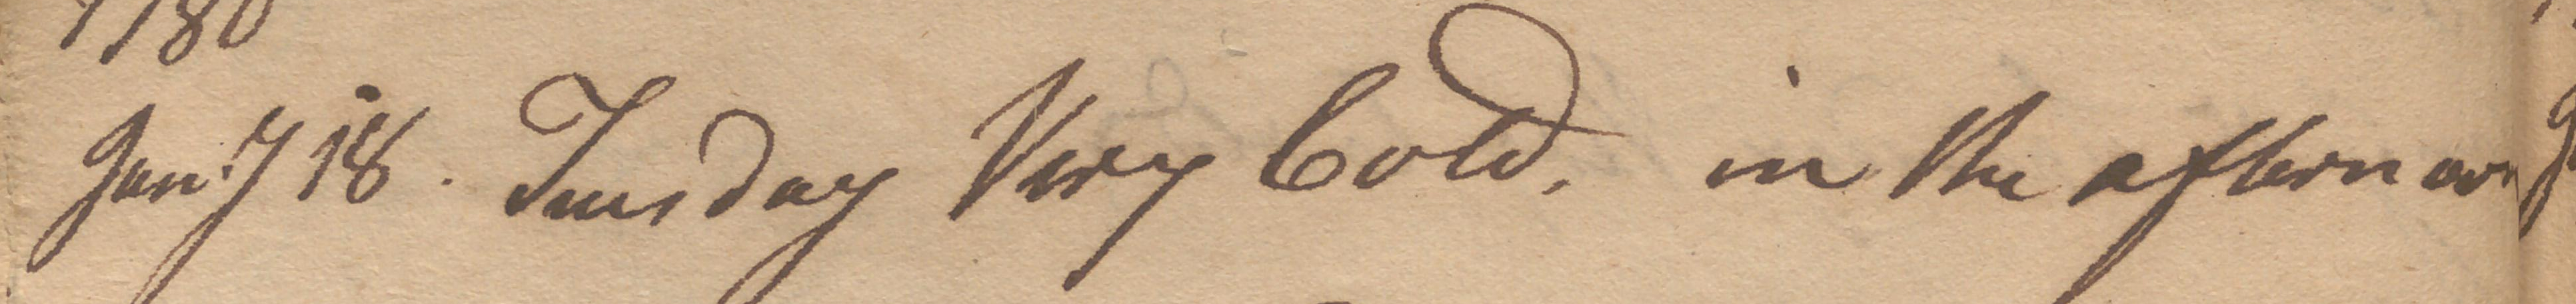Jan^y 18. Tuesday Very Cold. in the afternoon
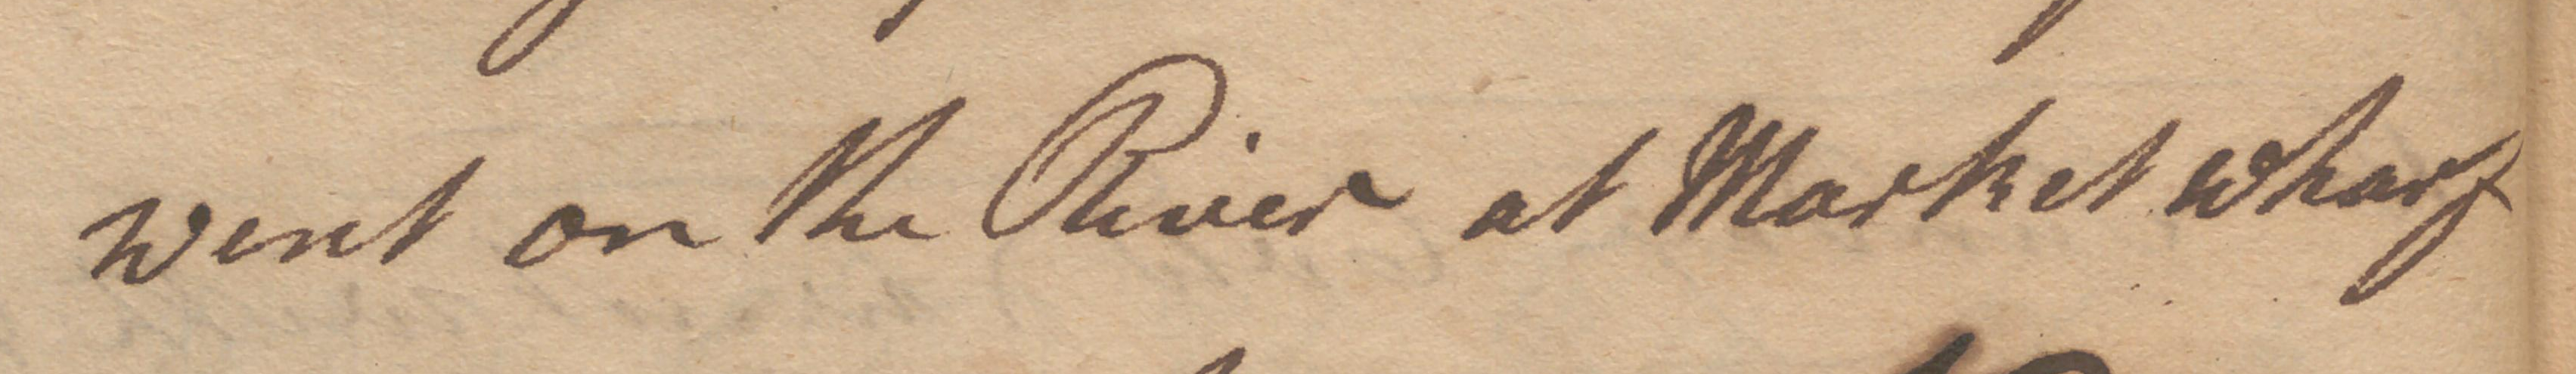went on the River at Market wharf
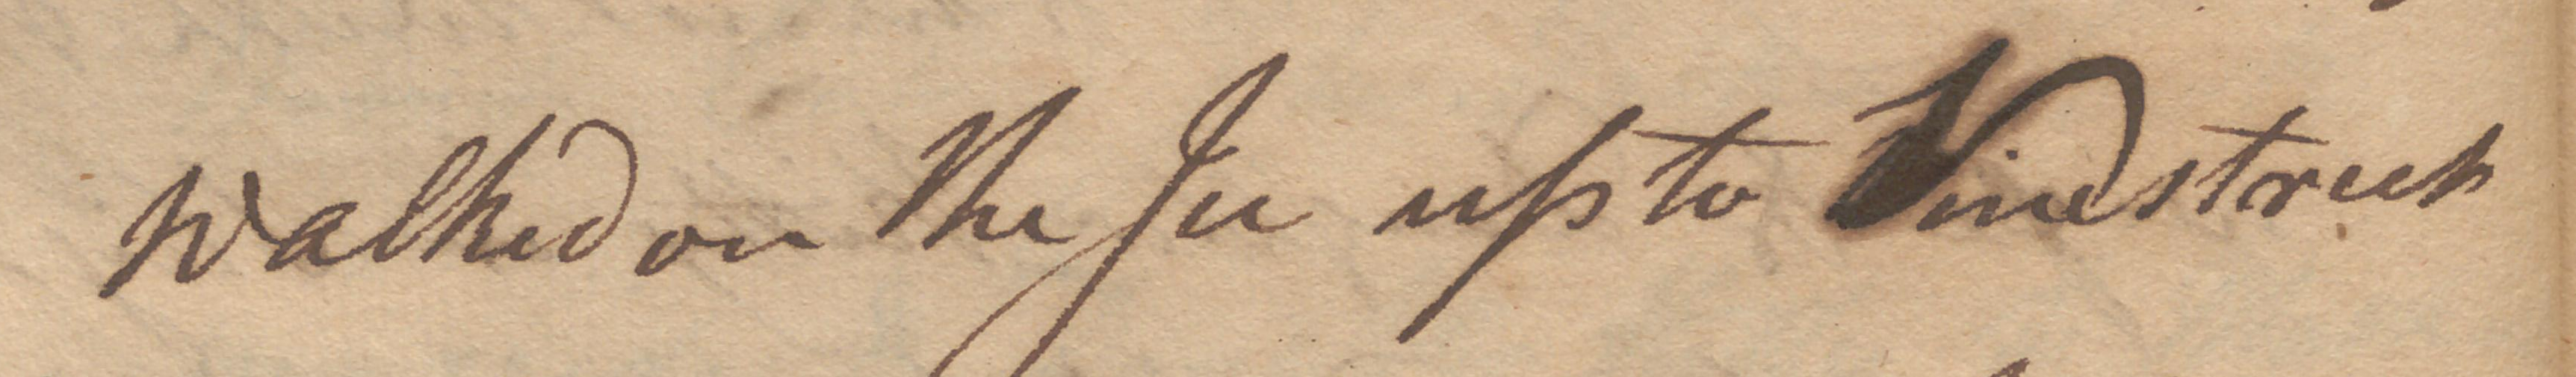walked on the Ice up to Vine street
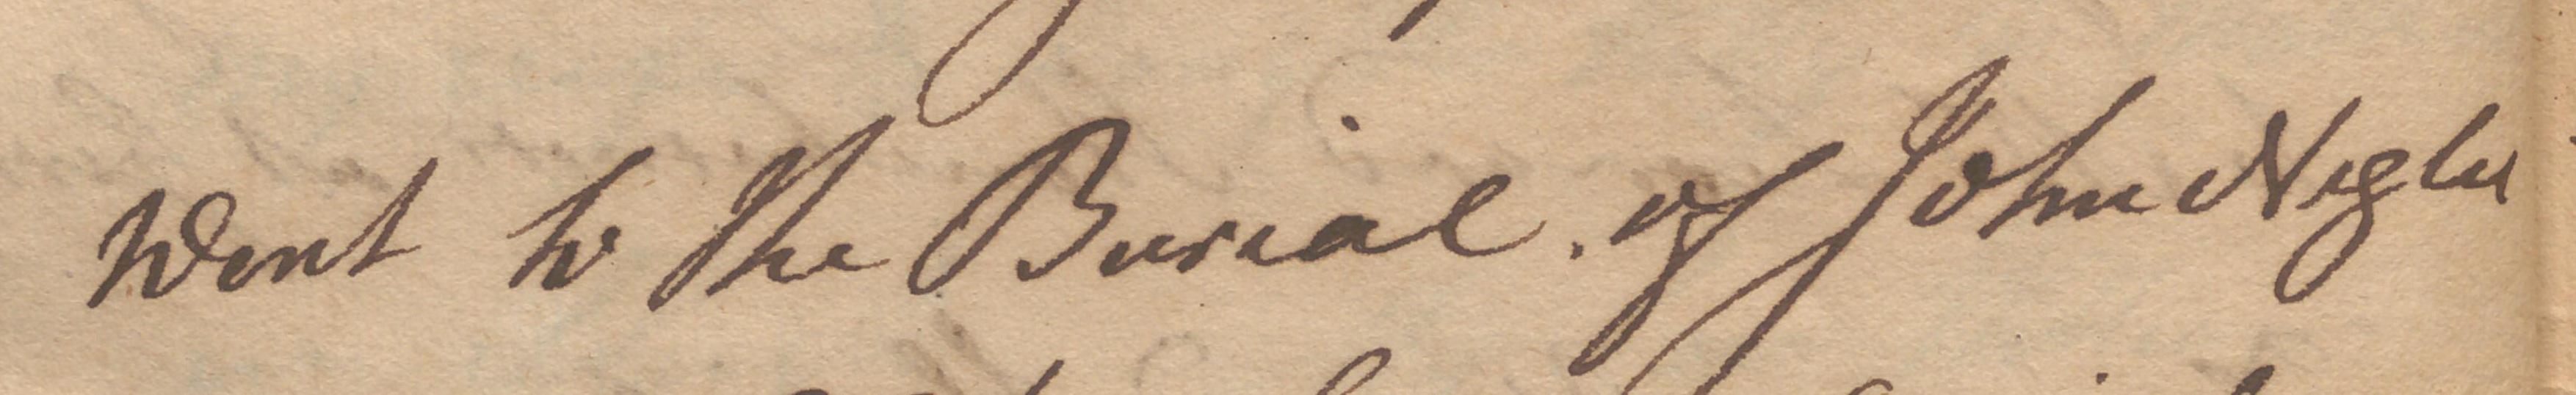went to the Burial of John Negles
